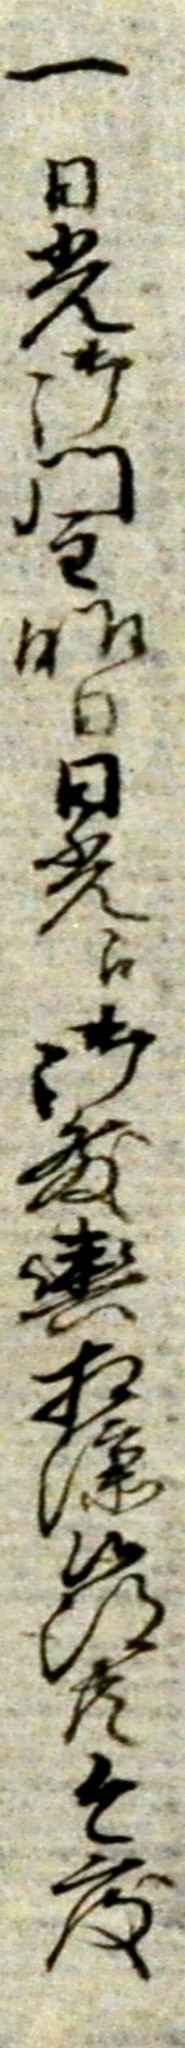一日光御門主昨日日光江御発輿相添候得共今度
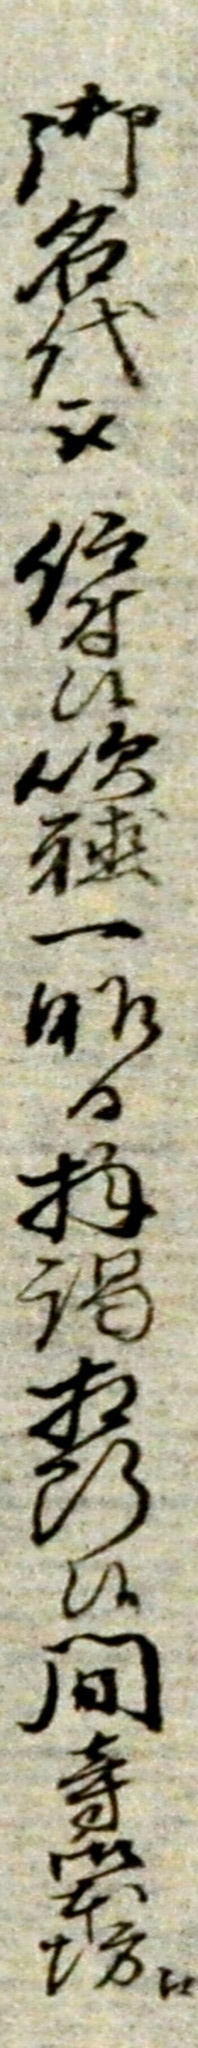御名代被仰付候吹聴一昨日拝謁相断候間旁御本坊江

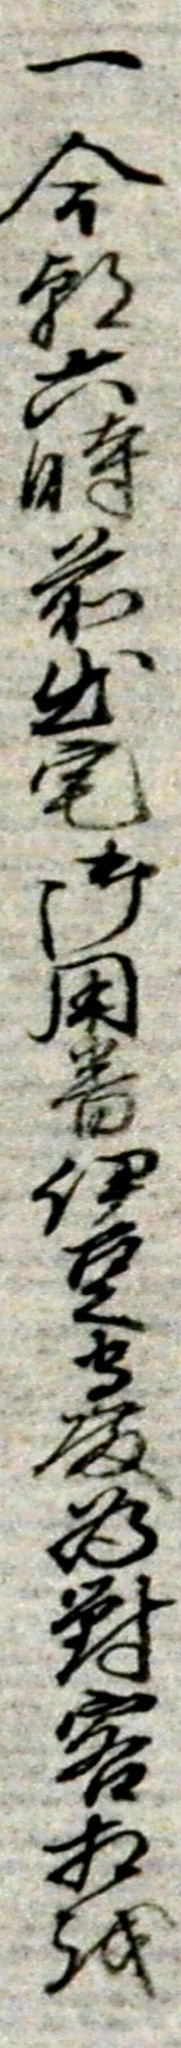一今朝六時前出宅御用番伊豆守殿為対客相越
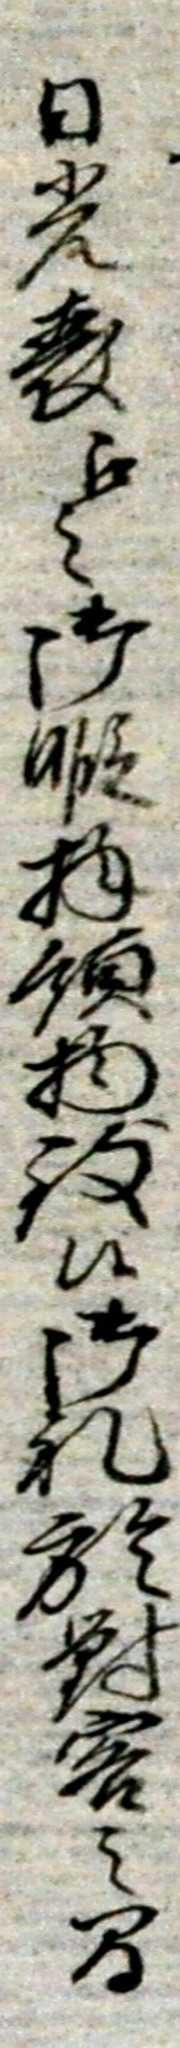日光表江之御暇拝領物致候御礼於対客之間
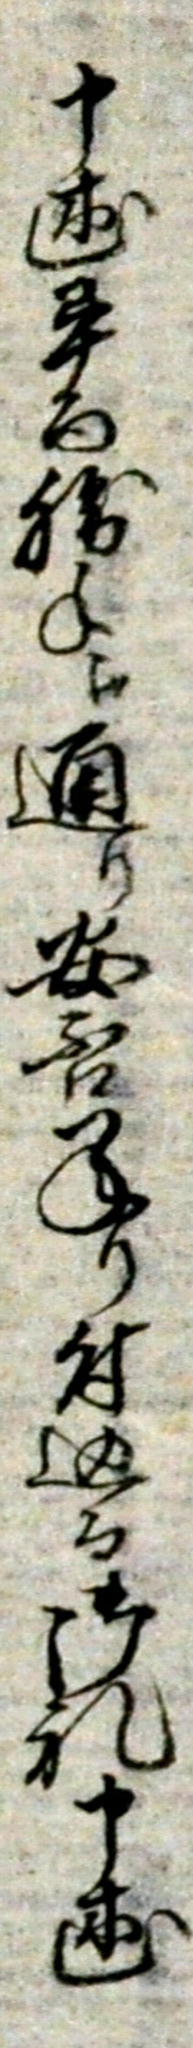申述畢而勝手江通り安否承リ付追而御礼申述
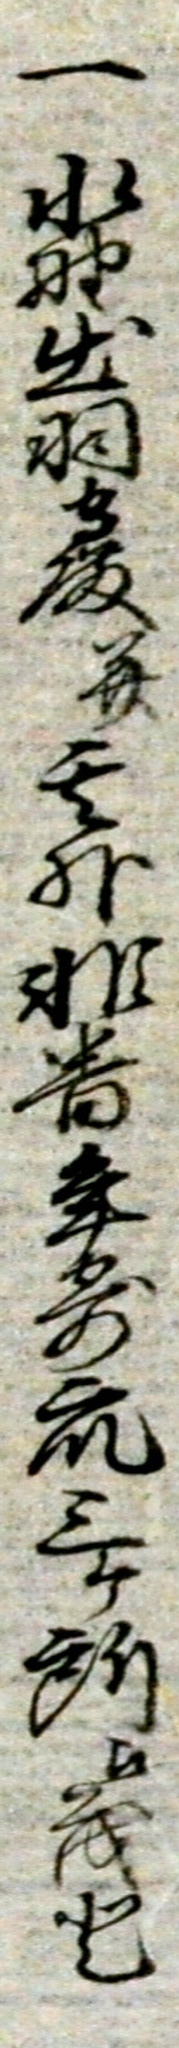一水野出羽守殿幷其非番年寄衆三ヶ所江茂登
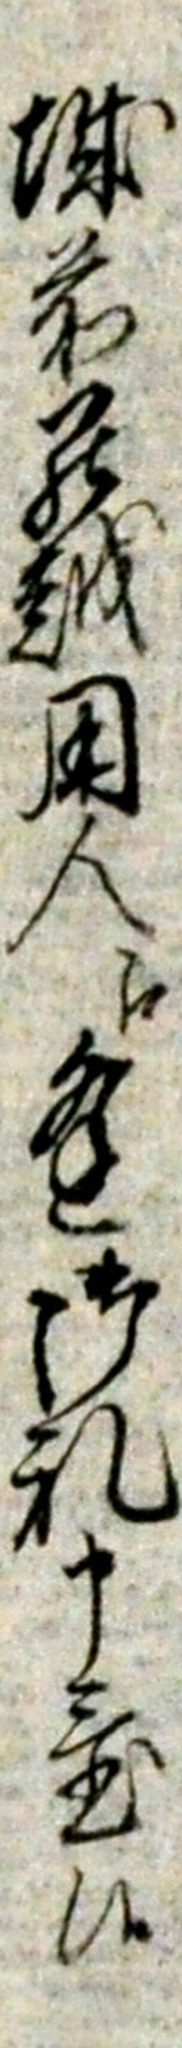城前罷越用人江逢御礼申置候
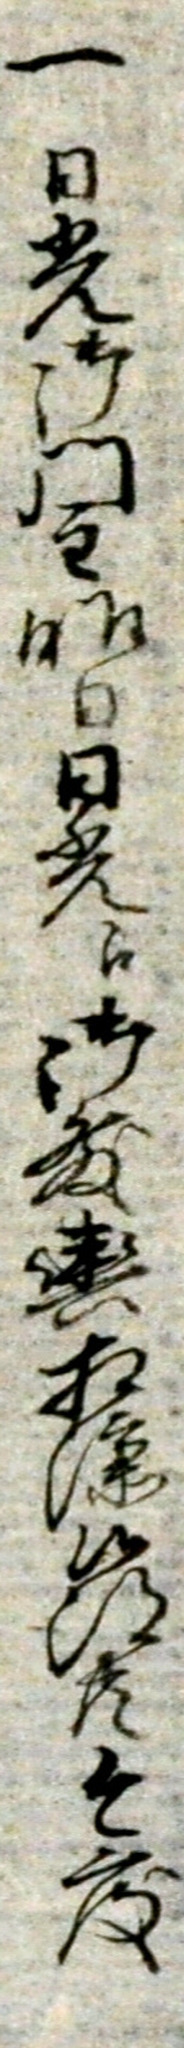一日光御門主昨日光江御発輿相済候得共今度
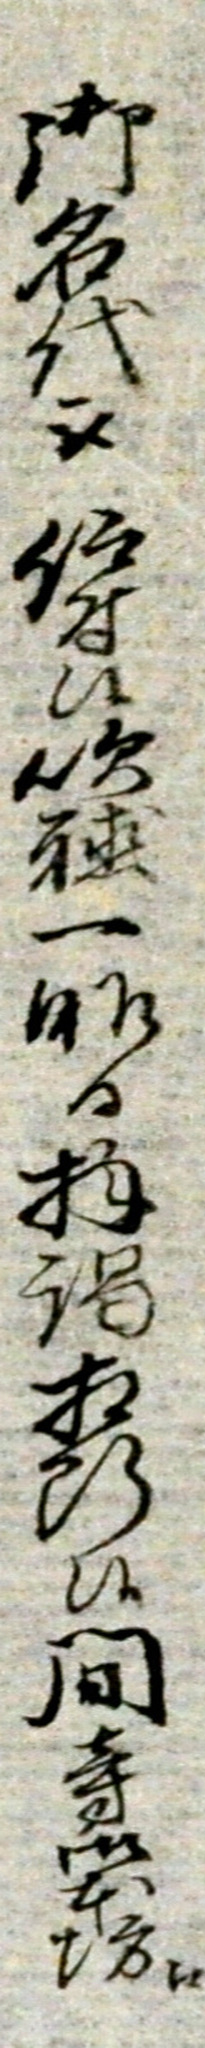御名代被仰付候吹聴一昨日拝謁相断候間旁御本坊江
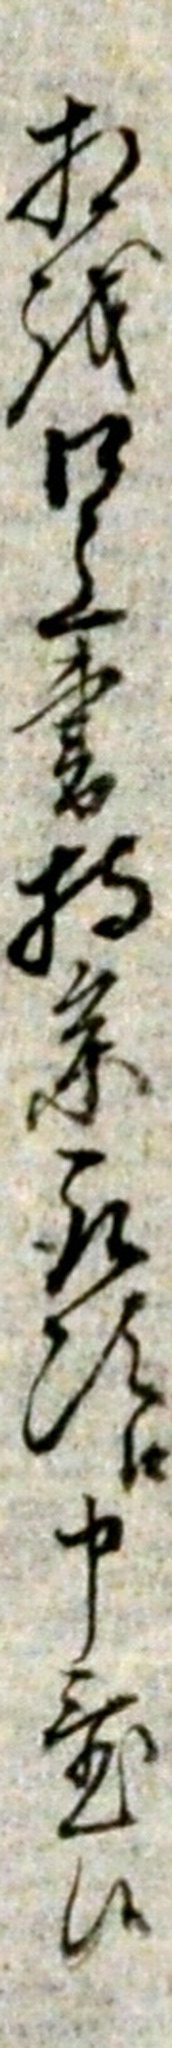相越口上書持参取次江申置候
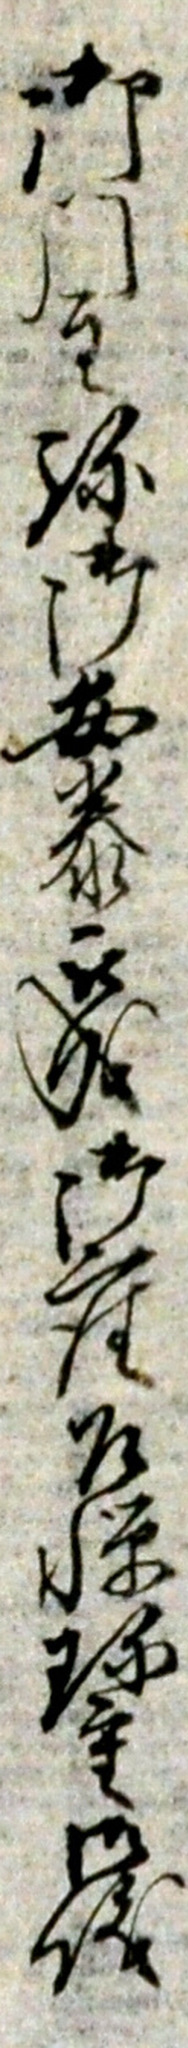御門主弥御安泰被成御座乍憚珎重御儀
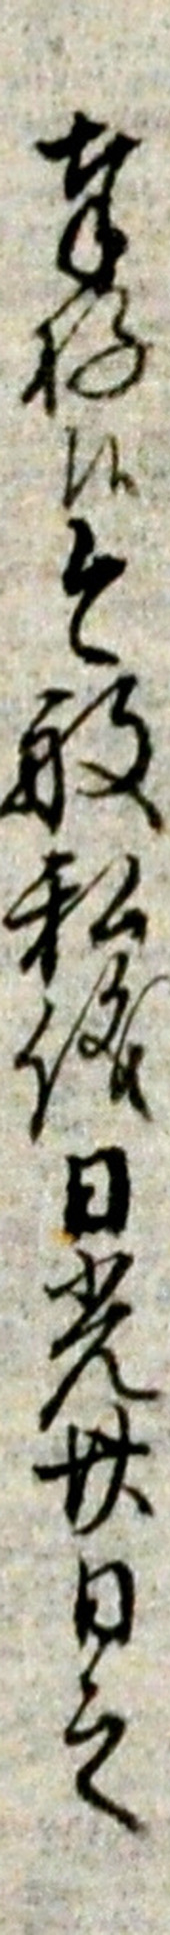奉存候今般私儀日光廿日之
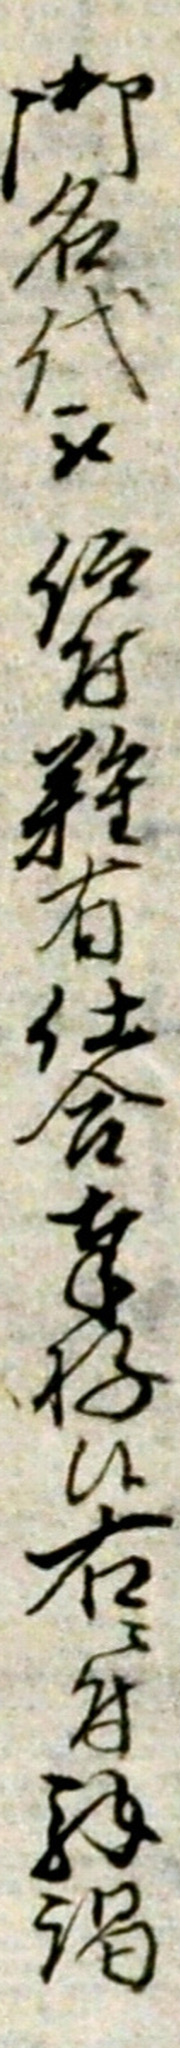御名代被仰付難有仕合奉存候右ニ付拝謁
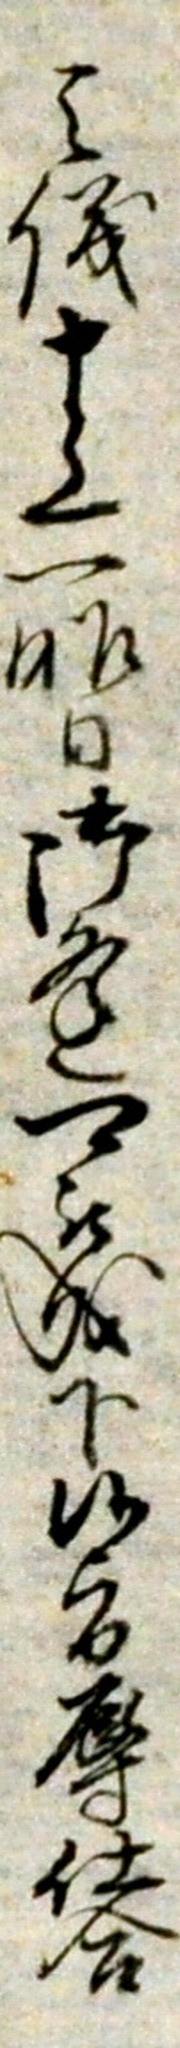之儀申上一昨日御逢可被成下候旨辱仕合
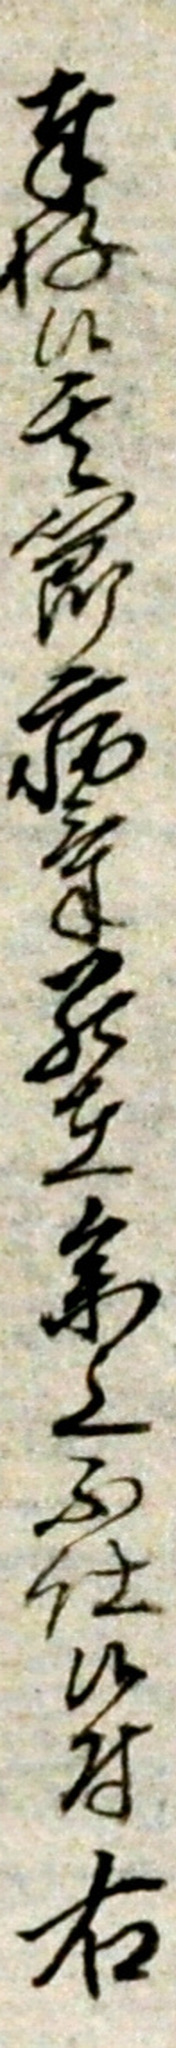奉存候其節病気罷在参上不仕候付右
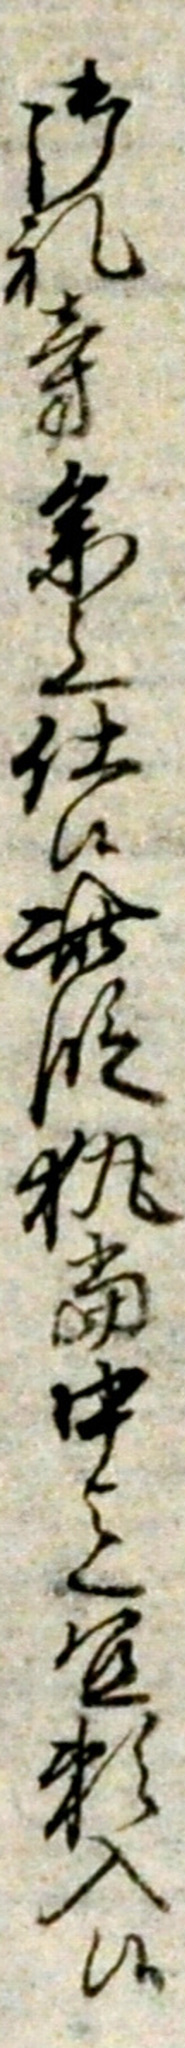御礼旁参上仕候此段執当中迄宜頼入候
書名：日光御名代相勤候節ノ留
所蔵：伊那市立高遠町図書館・合同会社AMANE
